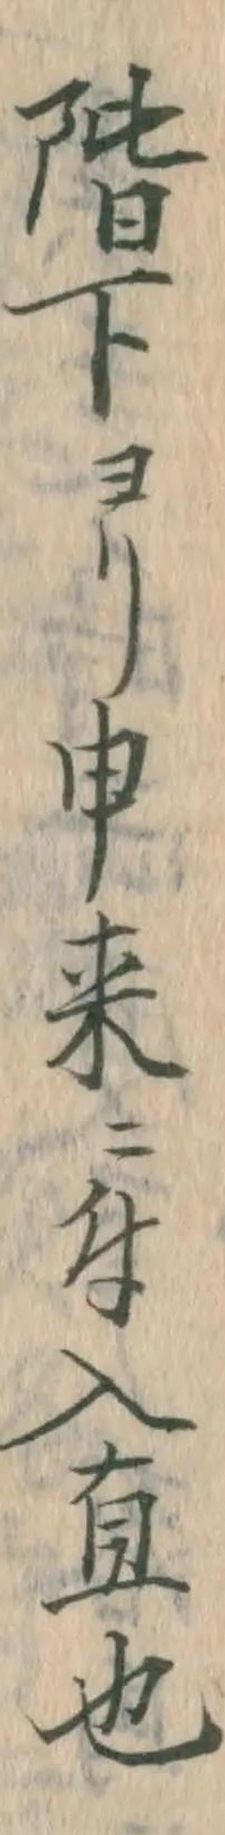階下ヨリ申来ニ付入直也
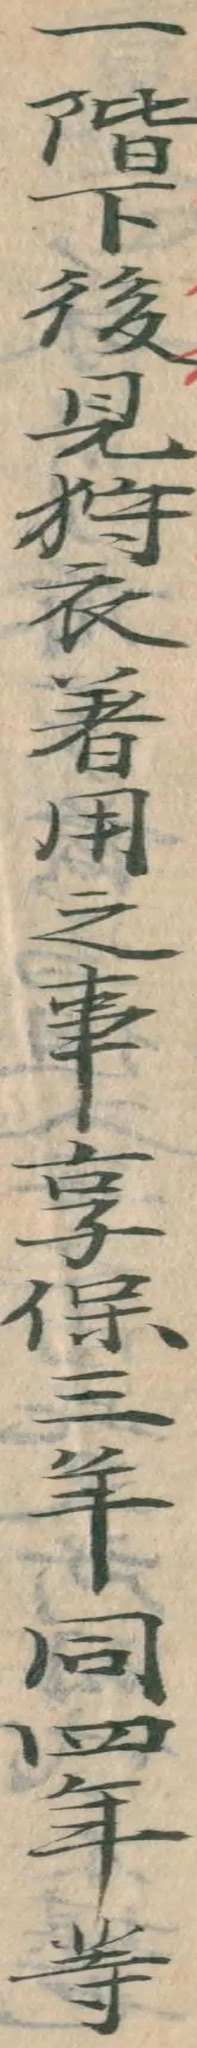一階下後見狩衣着用之事享保三年同四年等
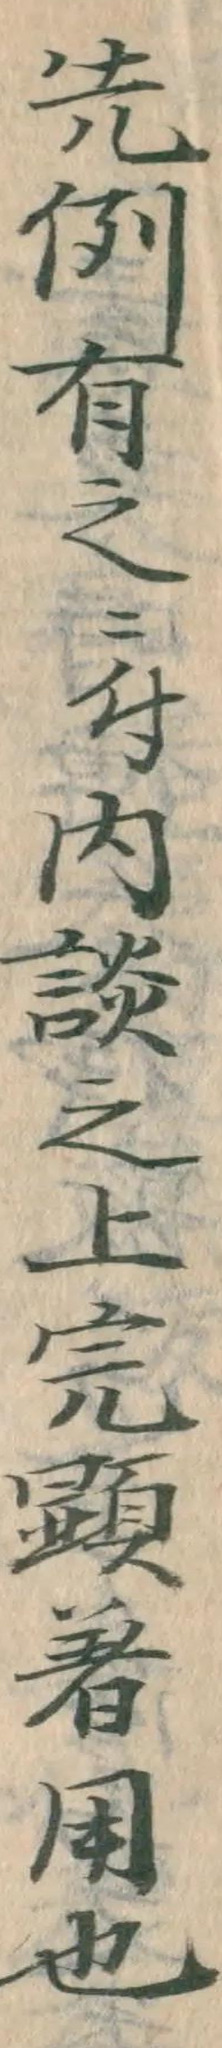先例有之ニ付内談之上完顕着用也
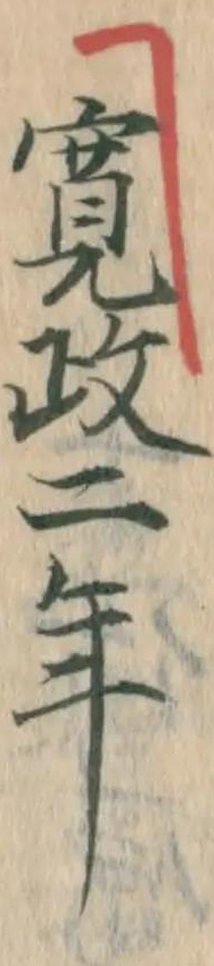寛政二年
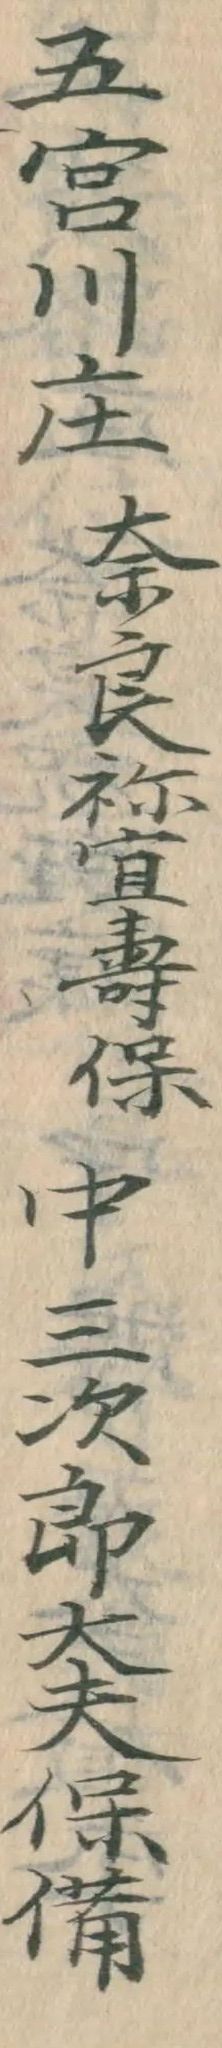五宮川庄奈良祢宜寿保中三次郎大夫保備
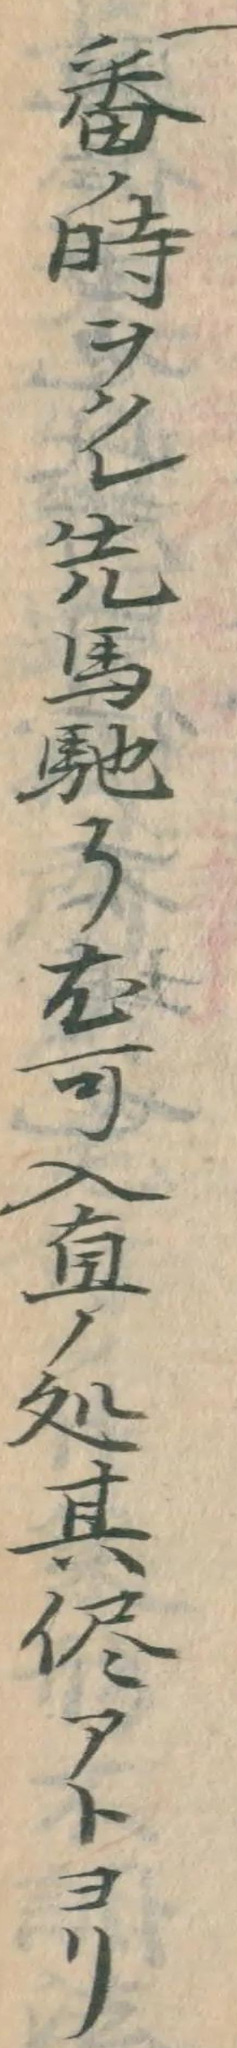(番ノ時ヲクレ先馬馳了尤可入直ノ処其侭アトヨリ

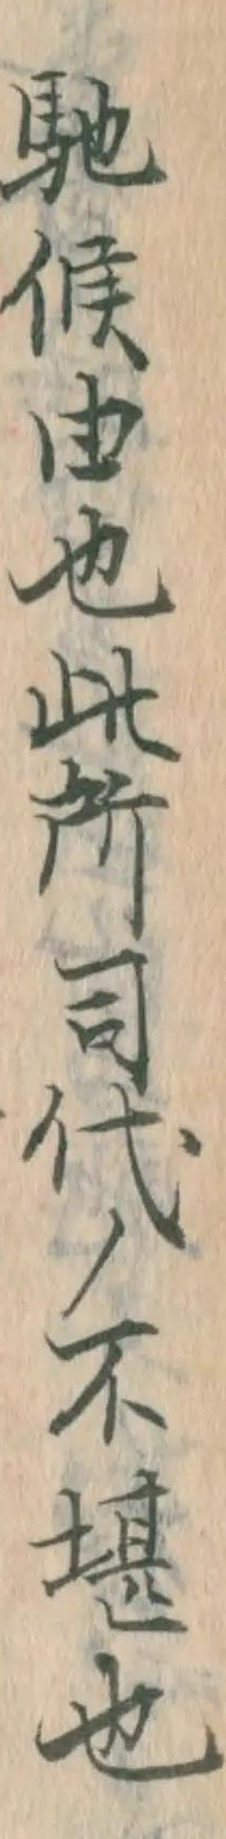馳候由也此所司代ノ不堪也
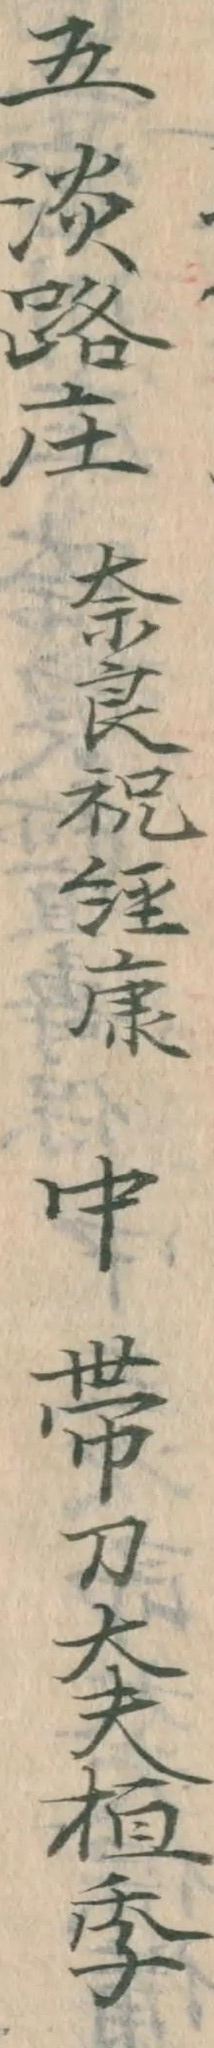五淡路庄奈良祝経康中帯刀大夫桓季
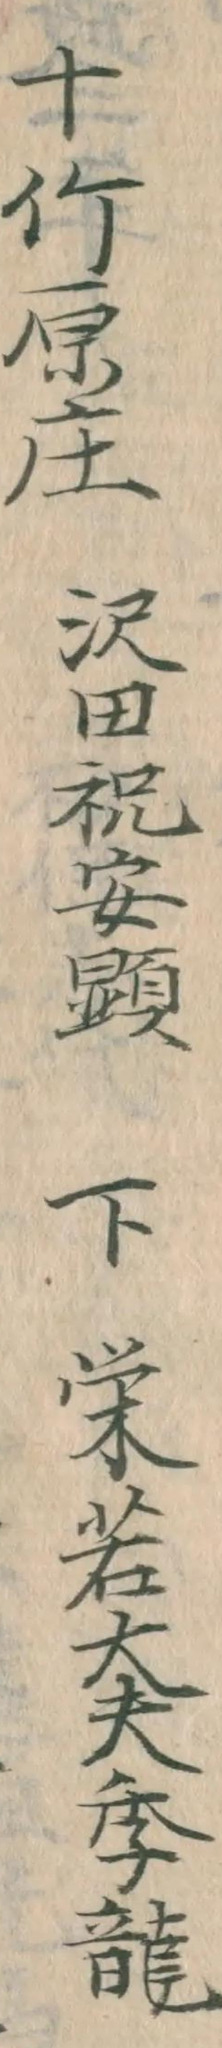十竹原庄沢田祝安顕下栄若大夫季龍
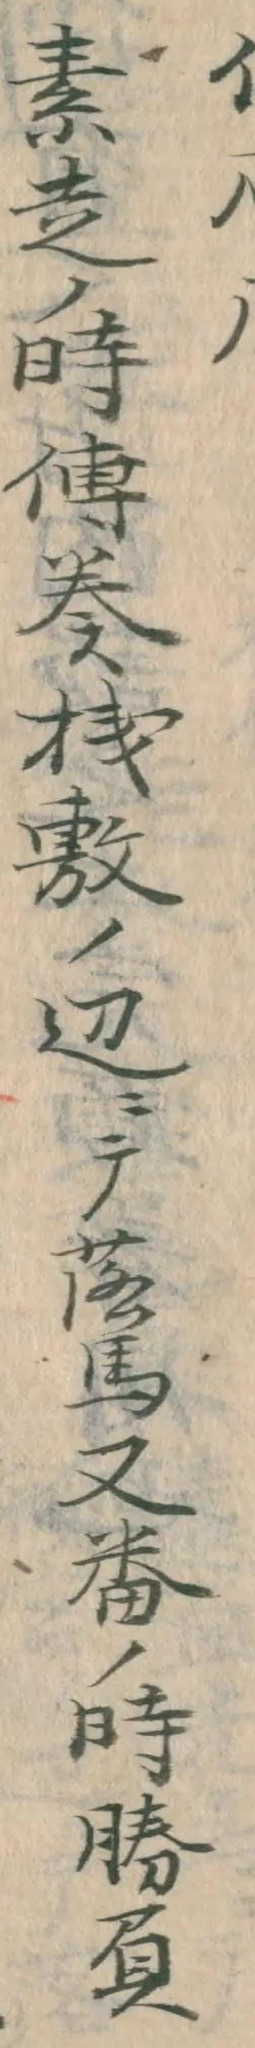素走ノ時伝奏桟敷ノ辺ニテ落馬又番ノ時勝負
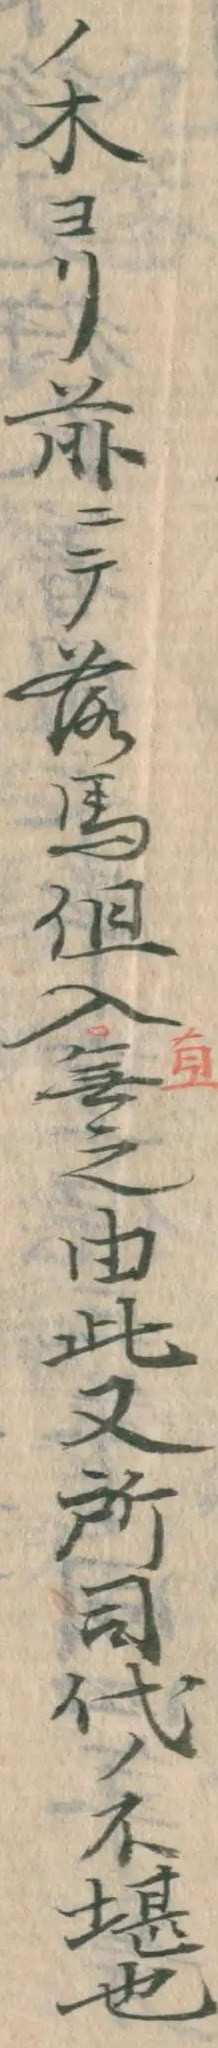ノ木ヨリ前ニテ落馬但入￮無之由此又所司代ノ不堪也
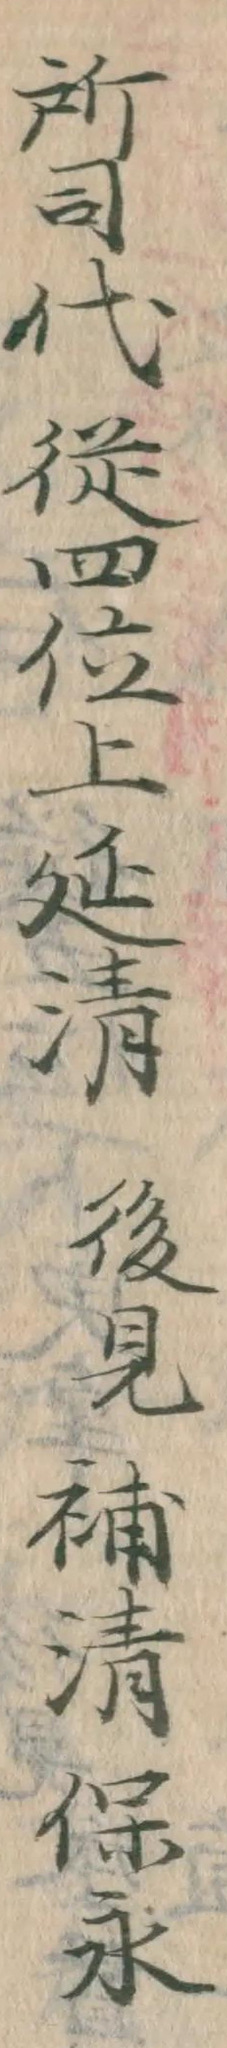所司代従四位上延清後見補清保永
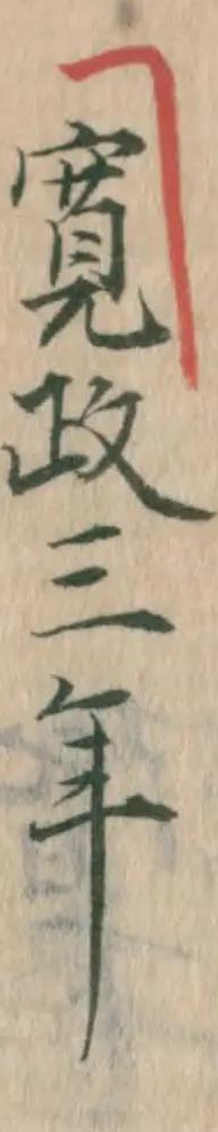寛政三年
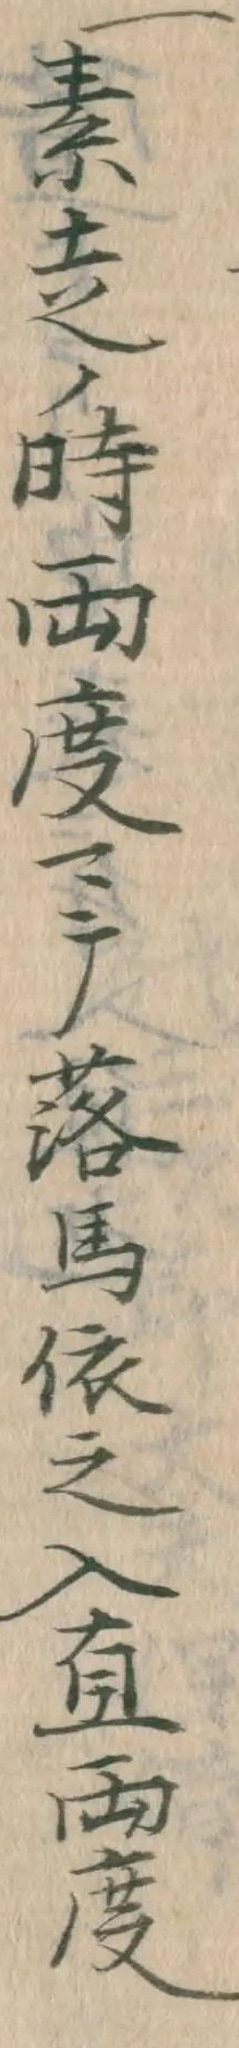(素走ノ時両度マテ落馬依之入直両度
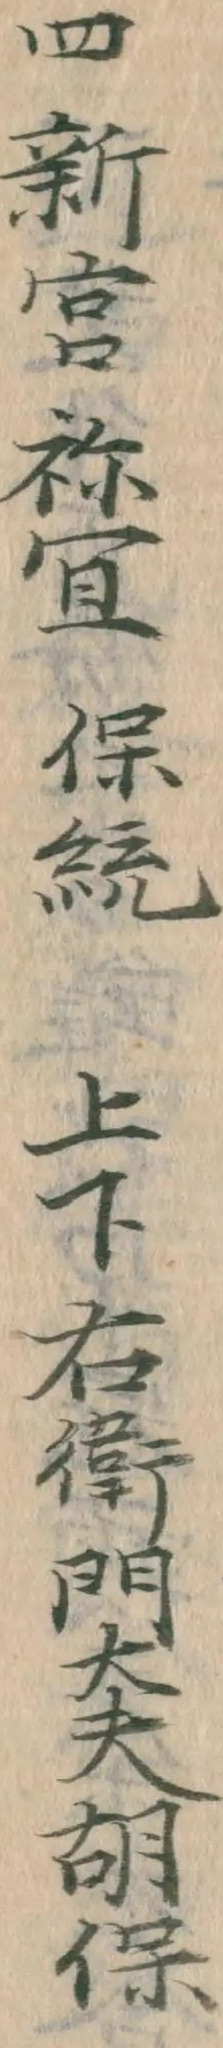四新宮祢宜保統上下右衛門大夫胡保
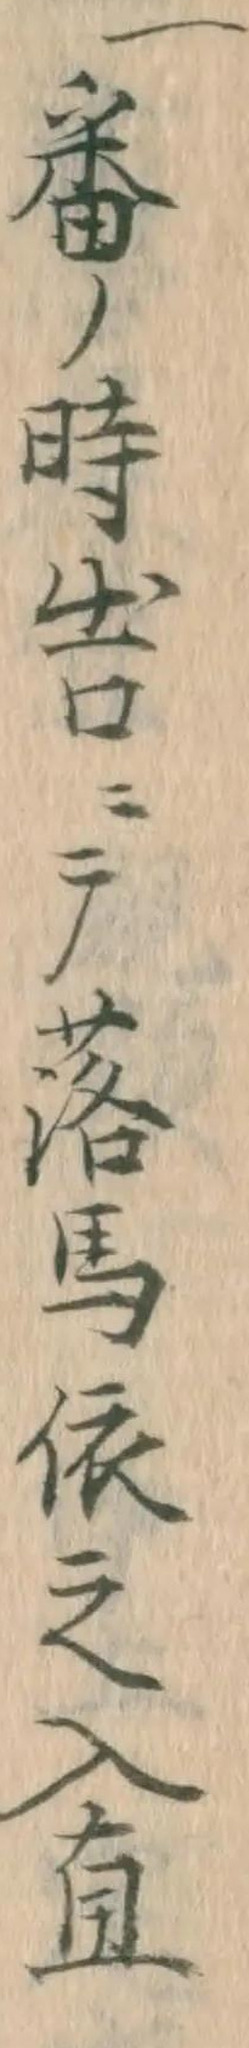(番ノ時出口ニテ落馬依之入直
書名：賀茂社記録. 第10冊
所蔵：国立国会図書館 National Diet Library, JAPAN
